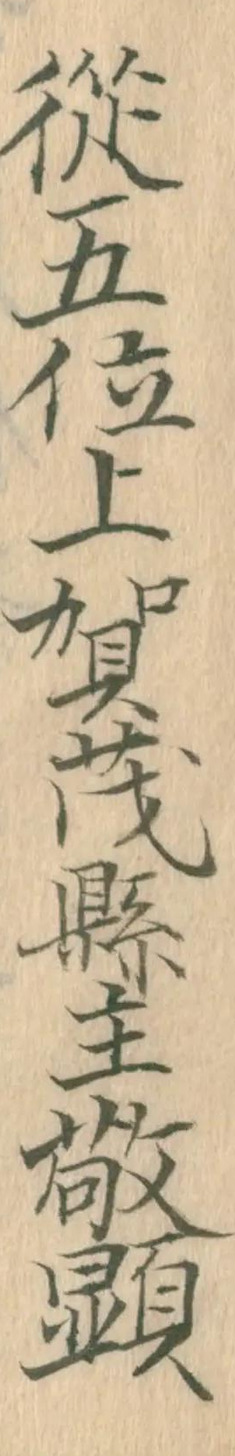従五位上賀茂県主敬顕

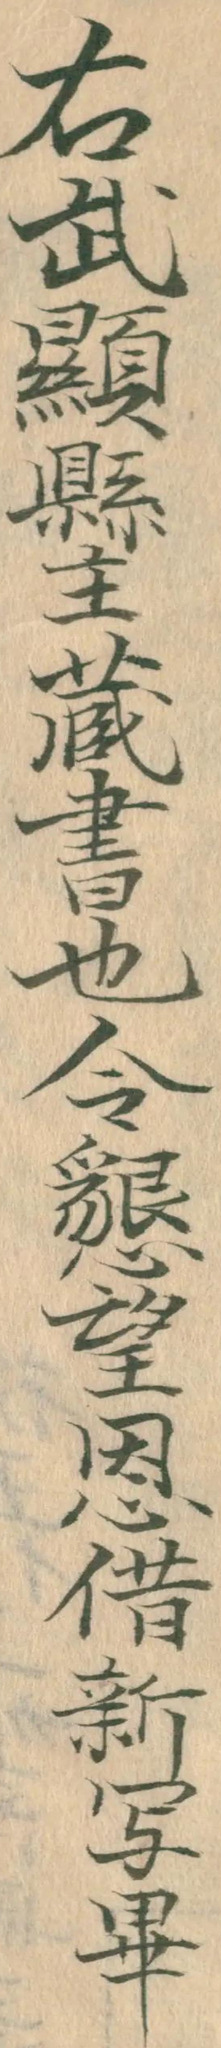右武顕県主蔵書也令懇望恩借新写畢
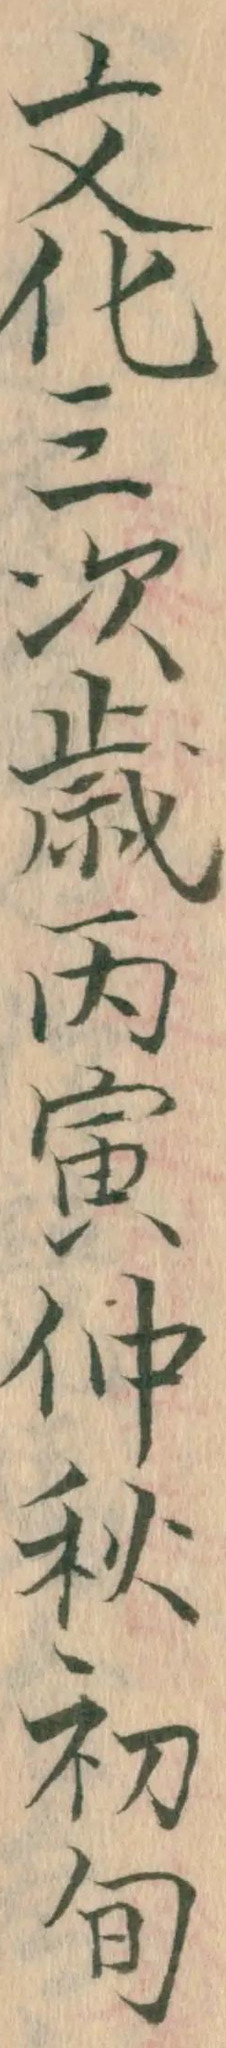文化三次歳丙寅仲秋初旬
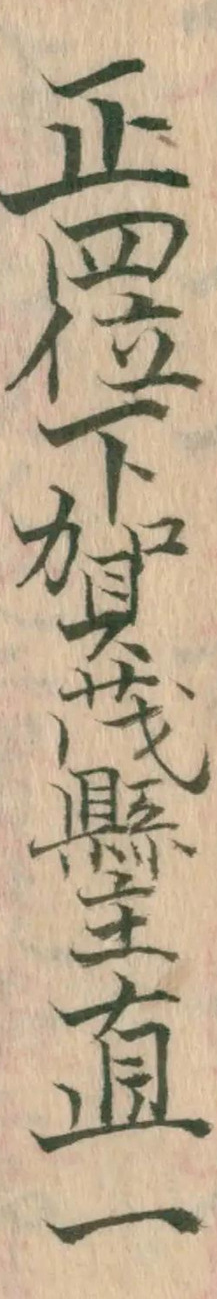正四位下賀茂県主直一
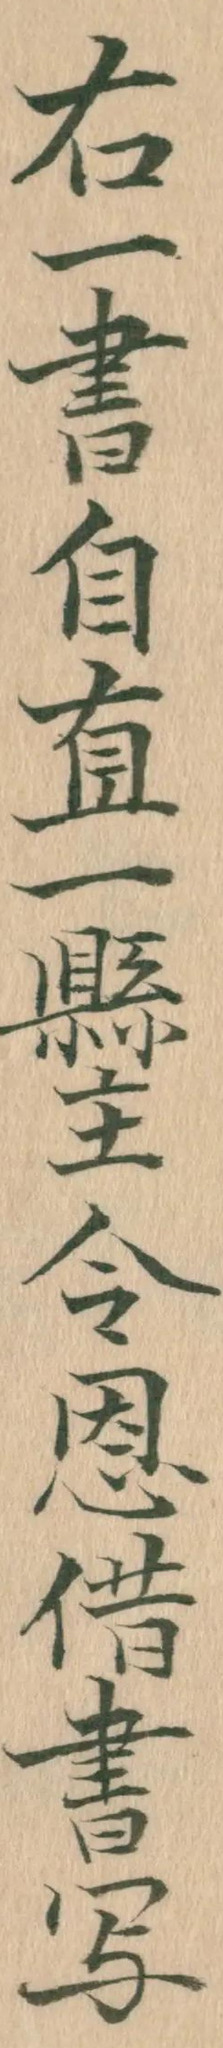右一書自直一県主令恩借書写
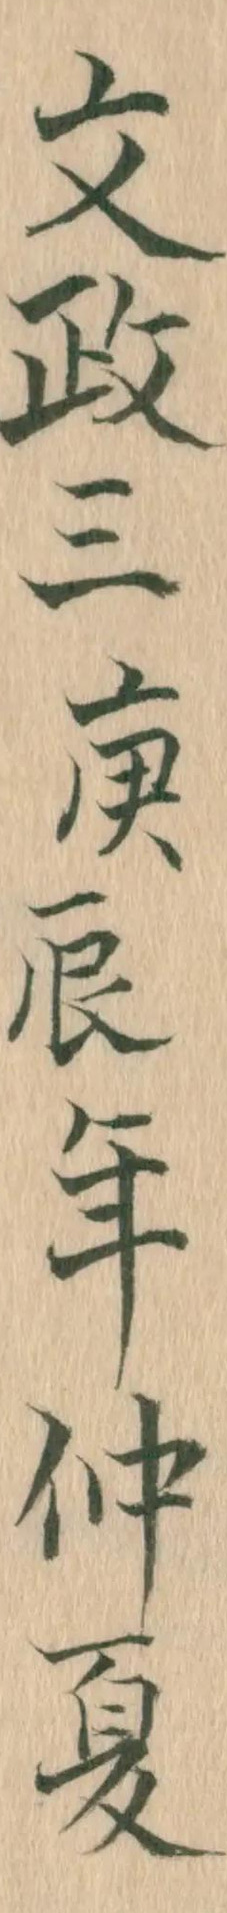文政三庚辰年仲夏
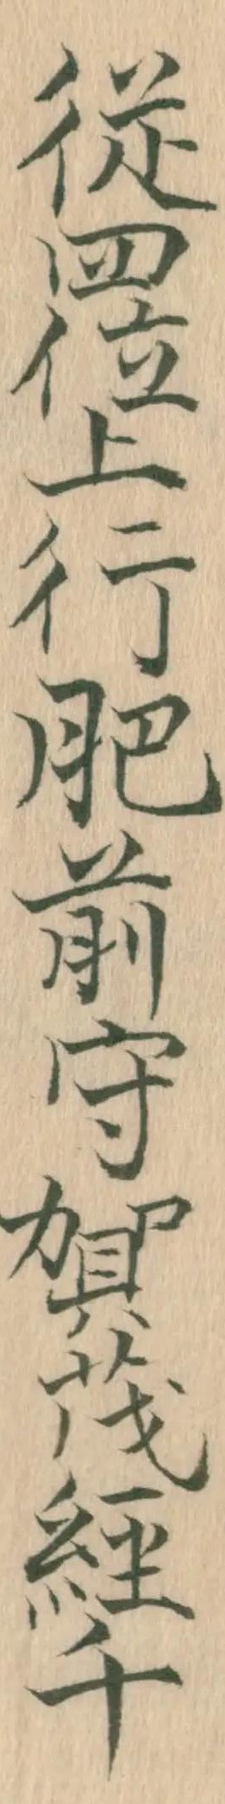従四位上行肥前守賀茂経千
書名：賀茂社記録. 第13冊
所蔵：国立国会図書館 National Diet Library, JAPAN
